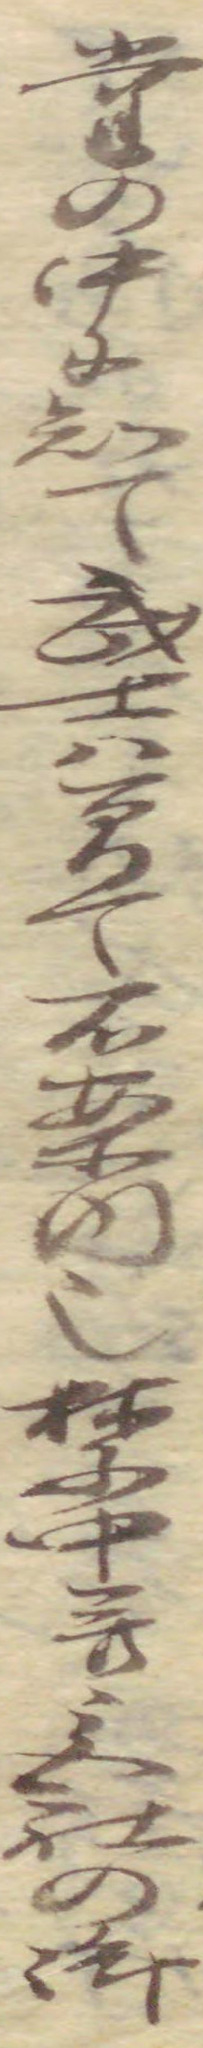掌の中に知て武士は曽て不案内也禁中并宮社の御
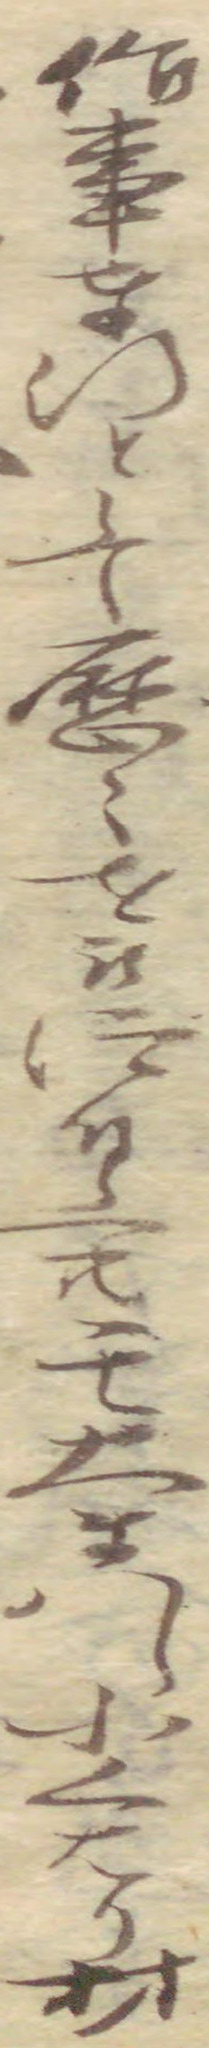作事奉行として歴〻を被仰付候へ共其大まはし小くはり材
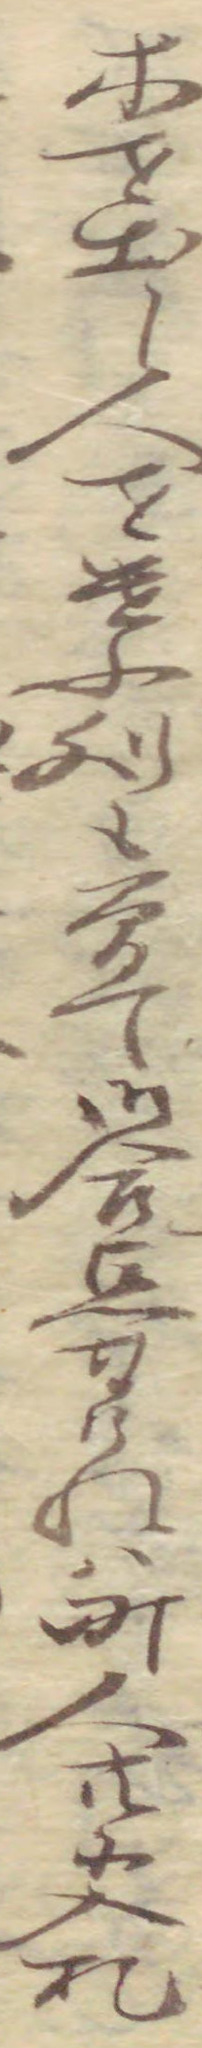木を出し人を遣ふ処も曽て御合点なけれは町人共に入札
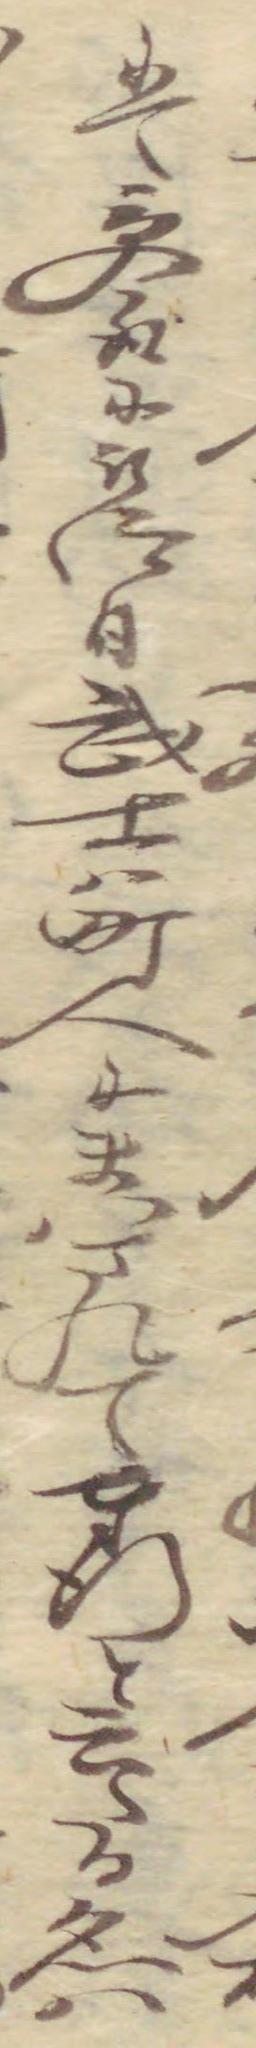にて受取に被仰付武士は町人にまはされて奉行と云たる名は
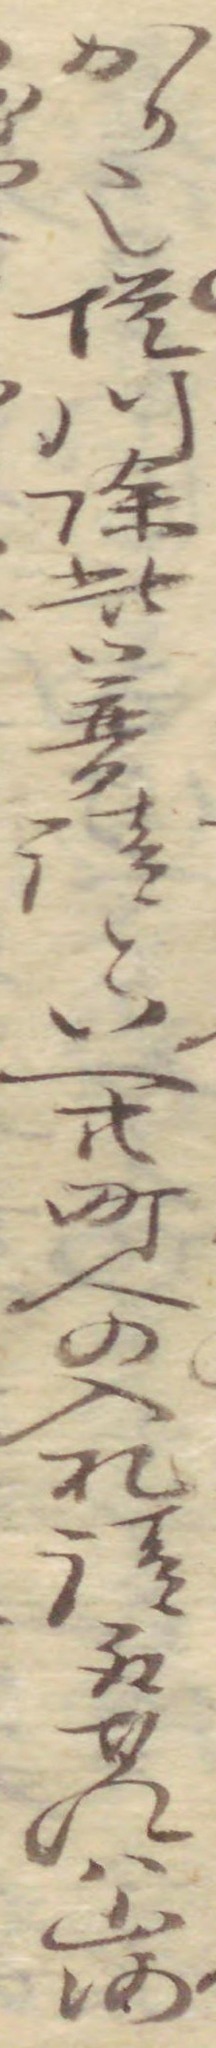かり也堤川除此御普請といへ共町人の入札受取なれは山河
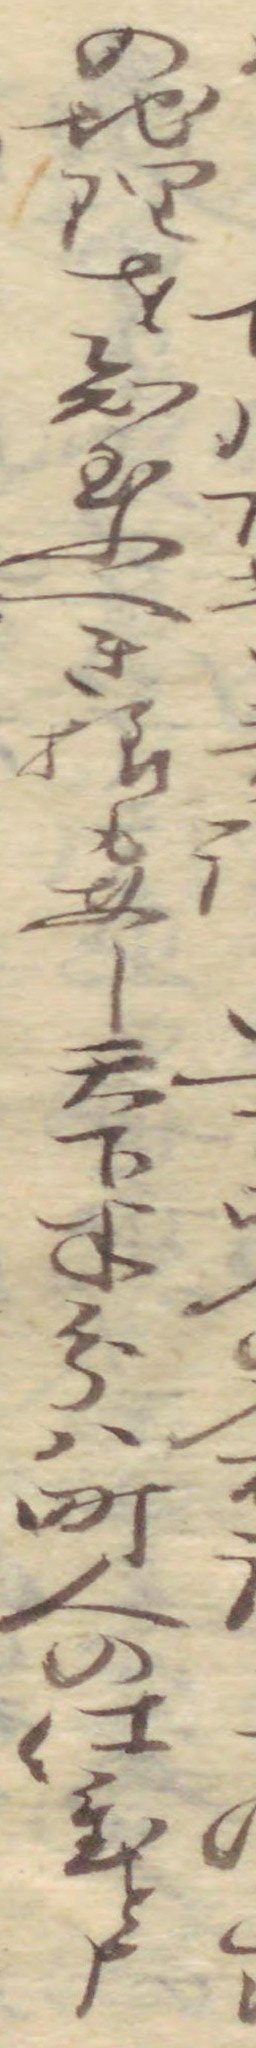の地理を知玉ふへき様もなし天下半分は町人の仕置と申
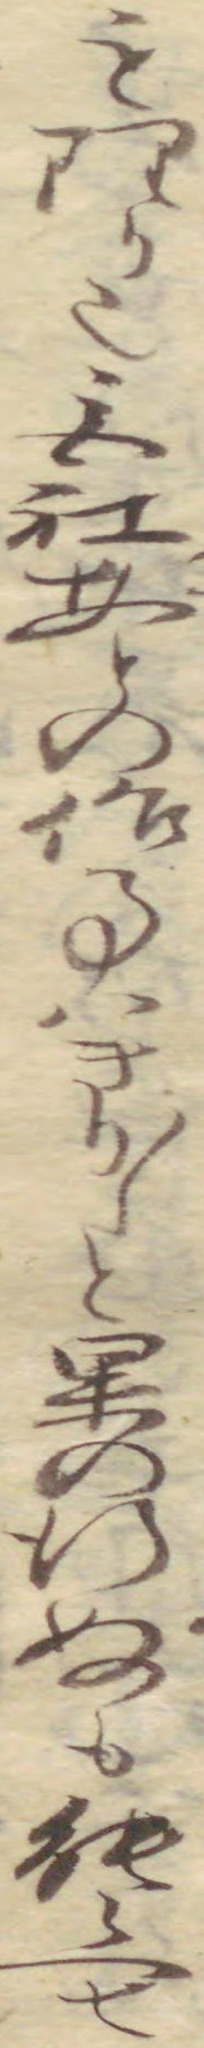も理り也宮社なとの作事はきり〳〵と果の行ぬも能候へは
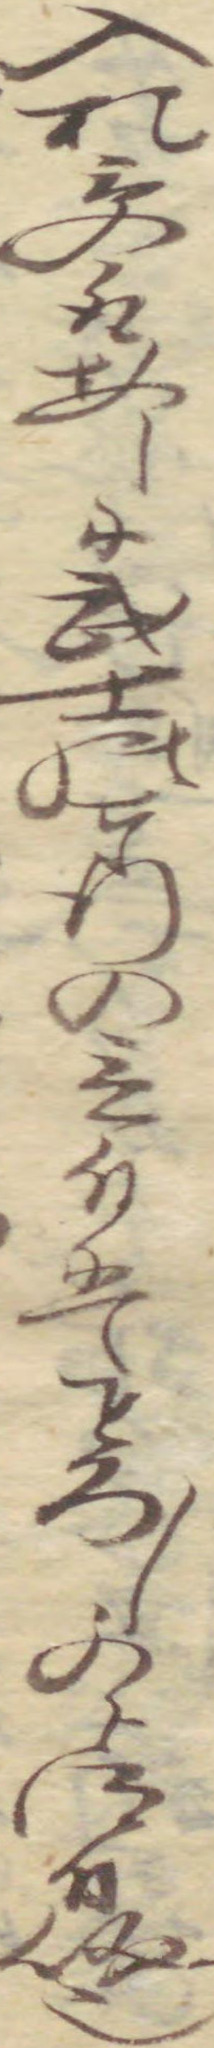入札受取なしに武士の奉行の言付にてそろ〳〵可被仰付儀也
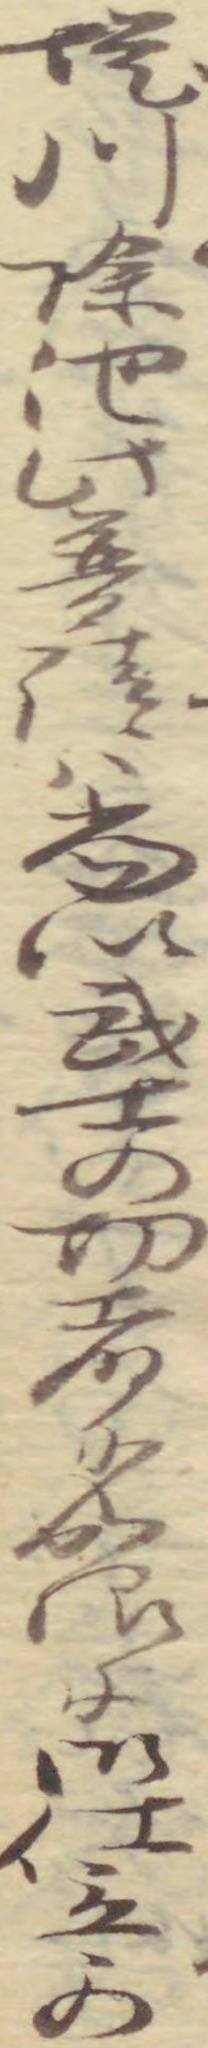堤川除他是普請は尚以武士の功者に成様に御仕立可
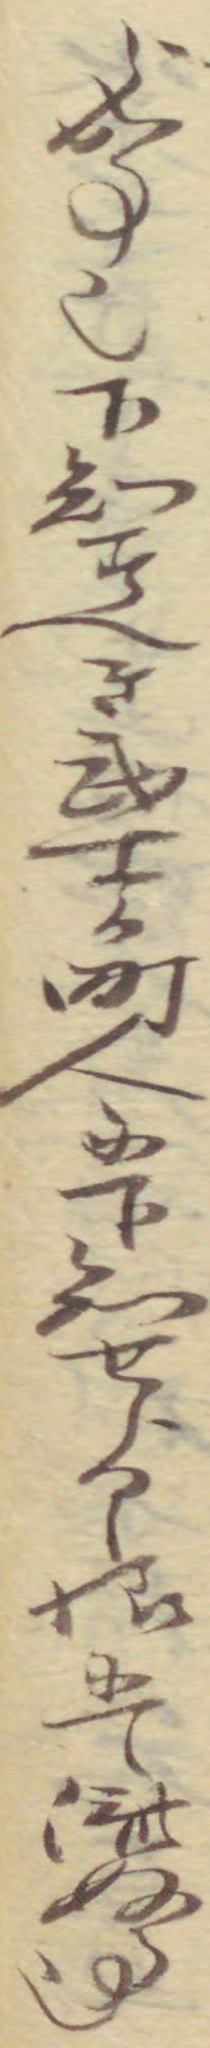被成事也下知すへき武士か町人に下知せらるゝ様にて済ぬ事也
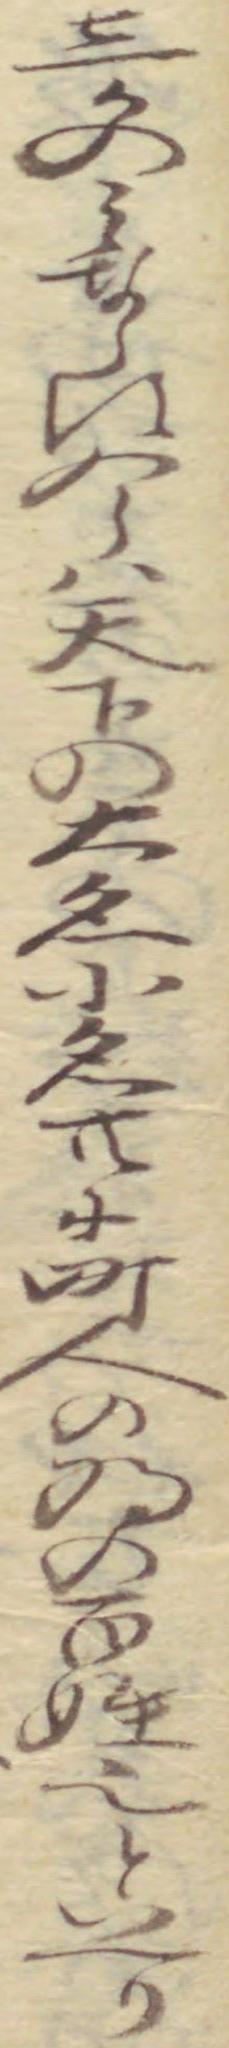しかのみならす今は天下の大名小名共に町人の為の百姓也といへり
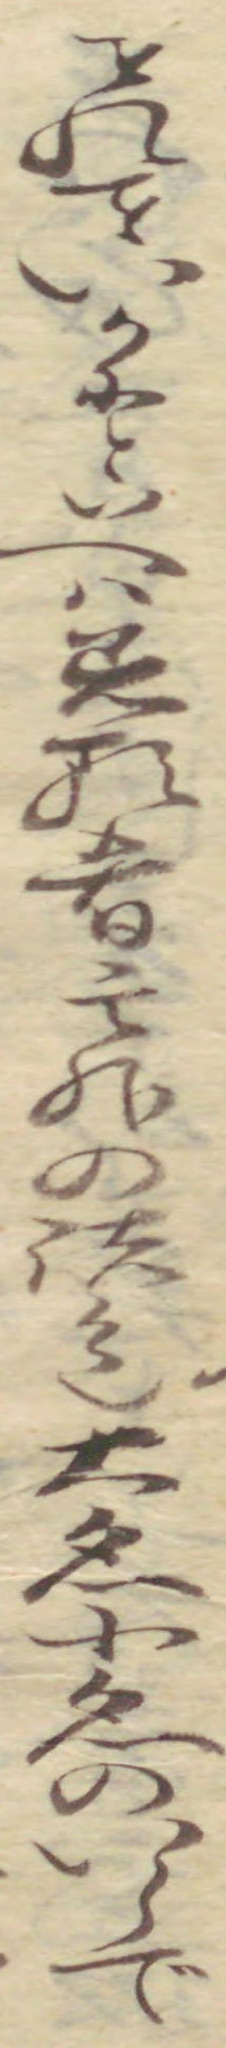それをいかにといへは着類肴其外の諸色大名小名のいらで
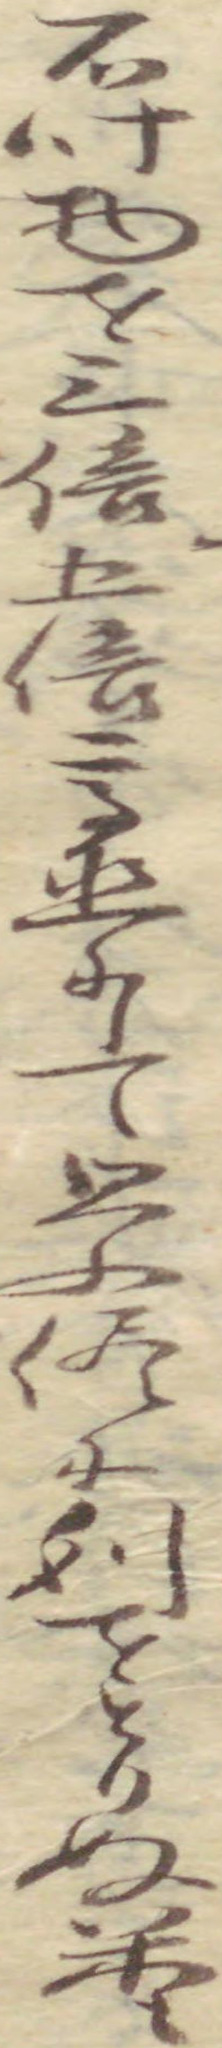不叶物を三倍五倍高直にして思ふ侭に利をとりぬ米も
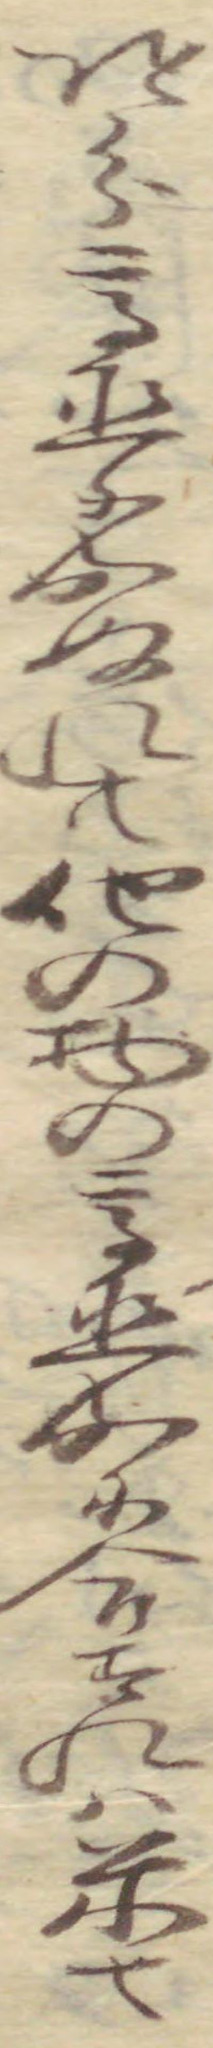随分高直に成ぬれ共他の物の高直成に合すれは米は
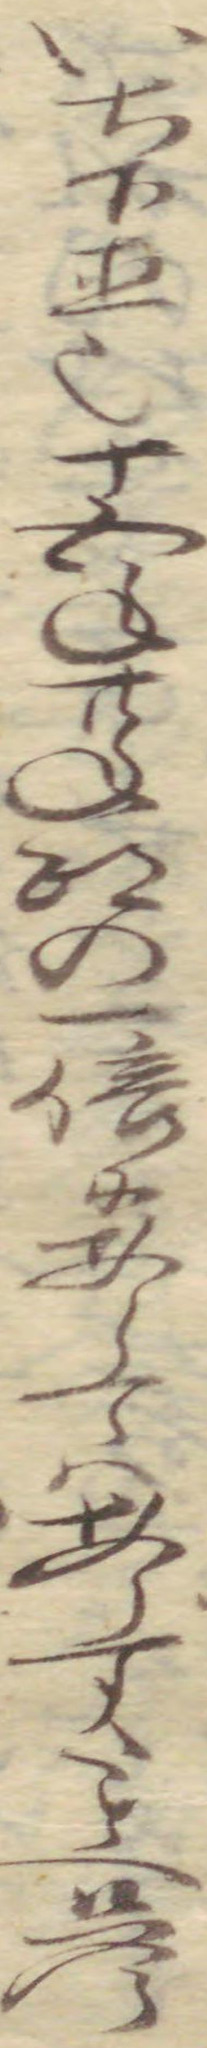いち下直也十五年廿年跡の一倍にならてはならすたとへ只今
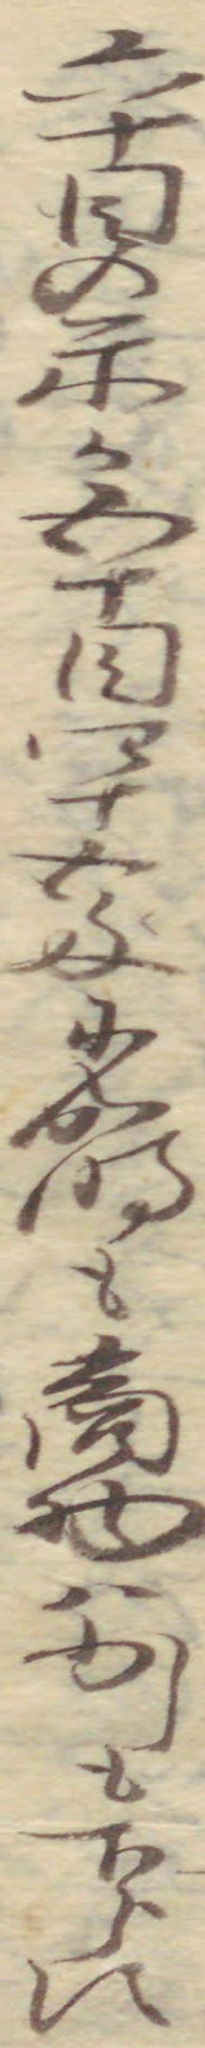六十目の米か五十目四十五両に成時も商物は少しも下らす
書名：鶯宿雑記. 巻263-264
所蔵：国立国会図書館 National Diet Library, JAPAN
